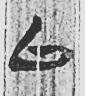㠯（以）
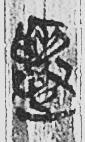{䙴止}
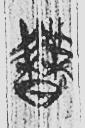{無日}
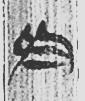於
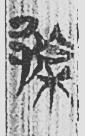{枼阝}
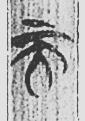而
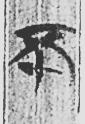不
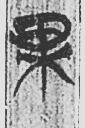果
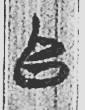𠂤
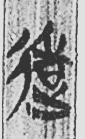造
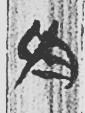於
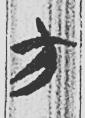方
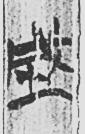城
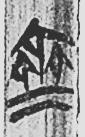齊
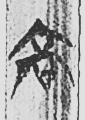高
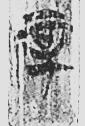厚
